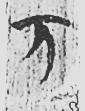兀
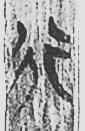行
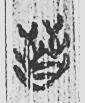晉
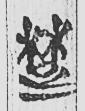楚
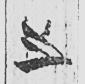之
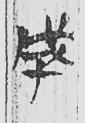成
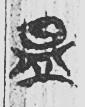昷
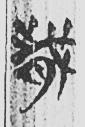歲
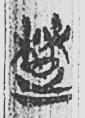楚
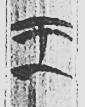王
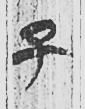子
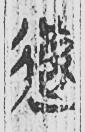{辶皮}
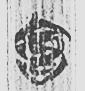會
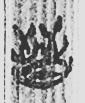晉
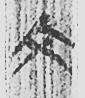文
